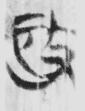政
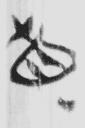直
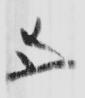之
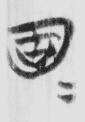固=
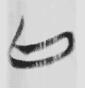㠯（以）
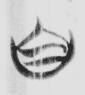自
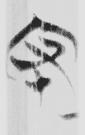守
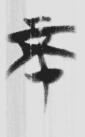不
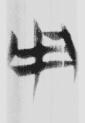用
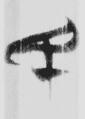民
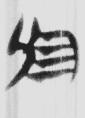於
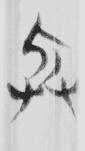兵
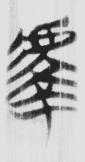{虍㚔}
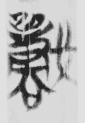戰
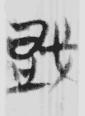{豆戈}
